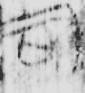司
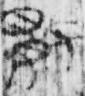敗
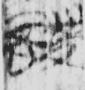○（察）
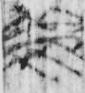羕
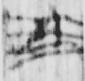陵
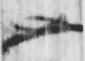之
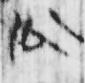州
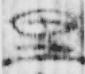里
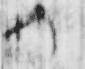人
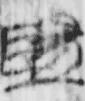○（陽）
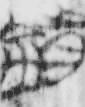鎆
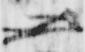之
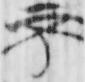不
